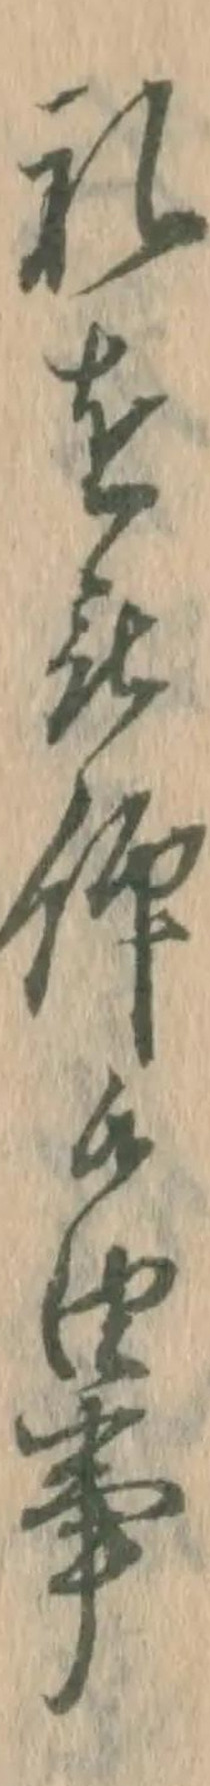礼を被仰候由事
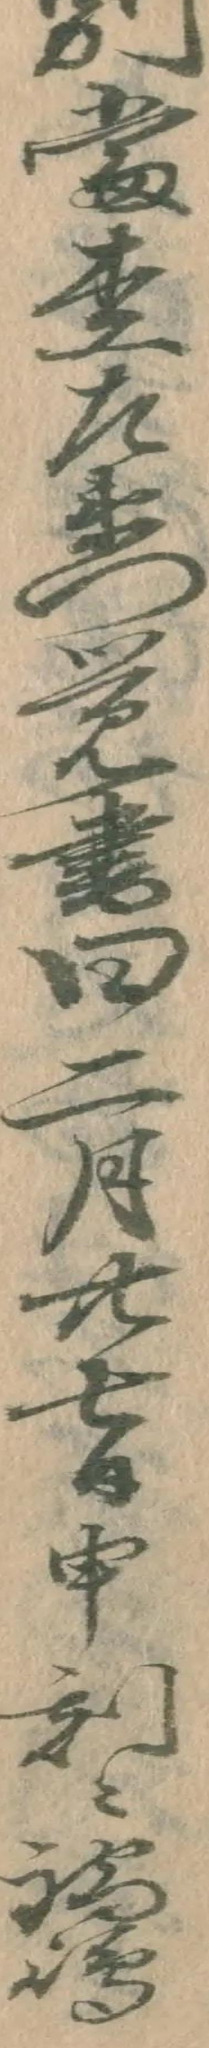別当杢左衛門覚書曰二月廿七日申刻に鍋島
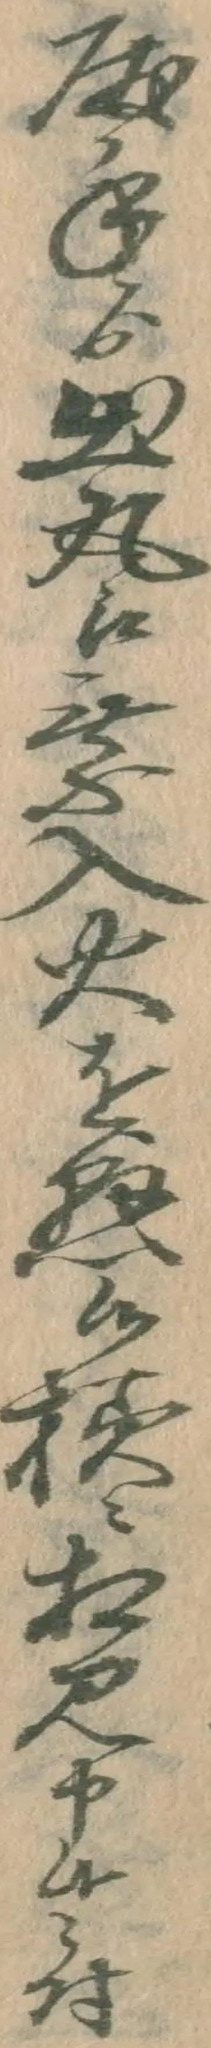殿手ゟ出丸江乗入火を懸候様に相見申候に付
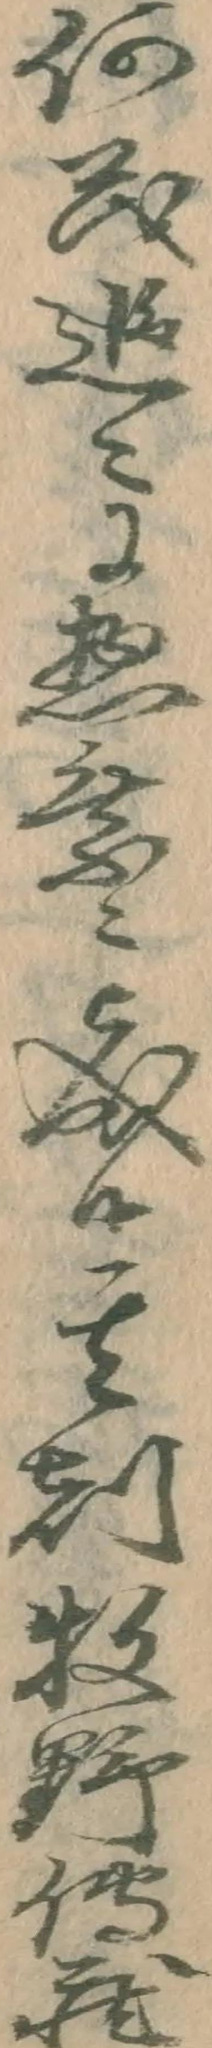何茂追々尓惣乗に被成候其刻牧野伝蔵
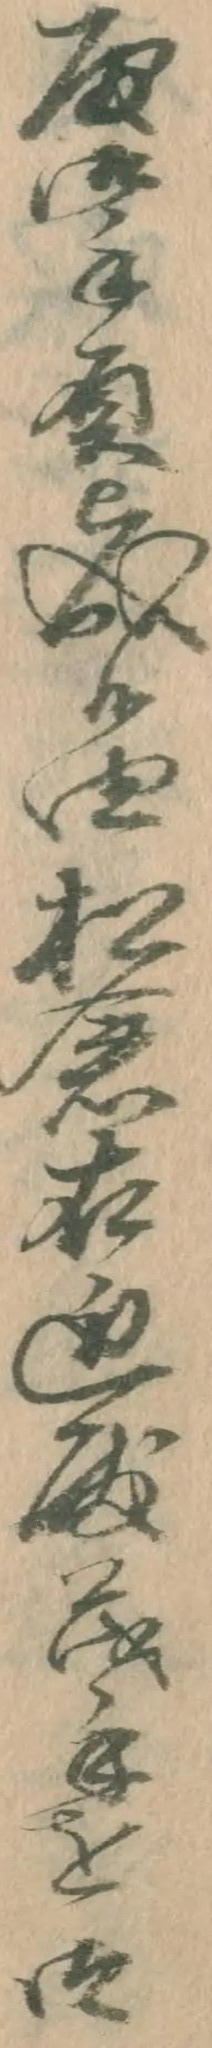殿御手負被成候由松倉右近殿茂手を御

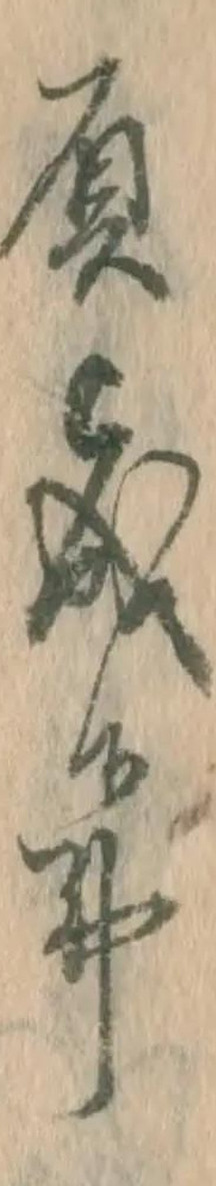負被成候事
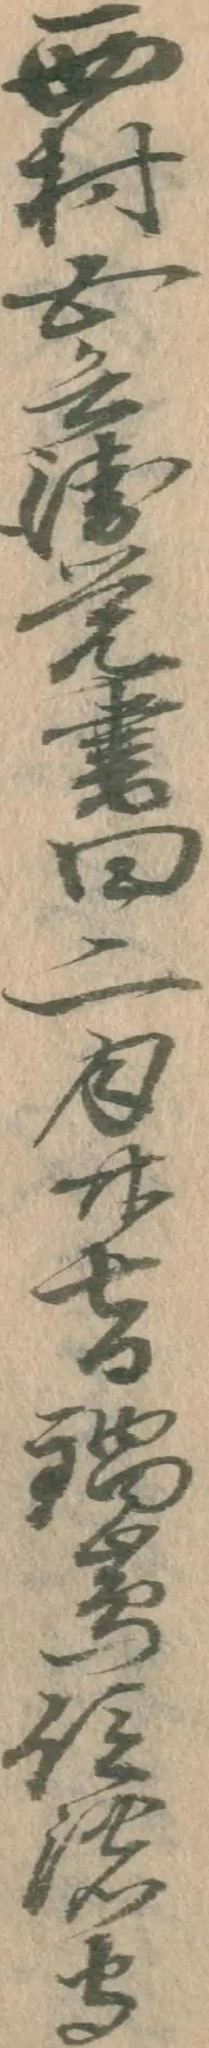西村五兵衛覚書曰二月廿七日鍋島信濃守
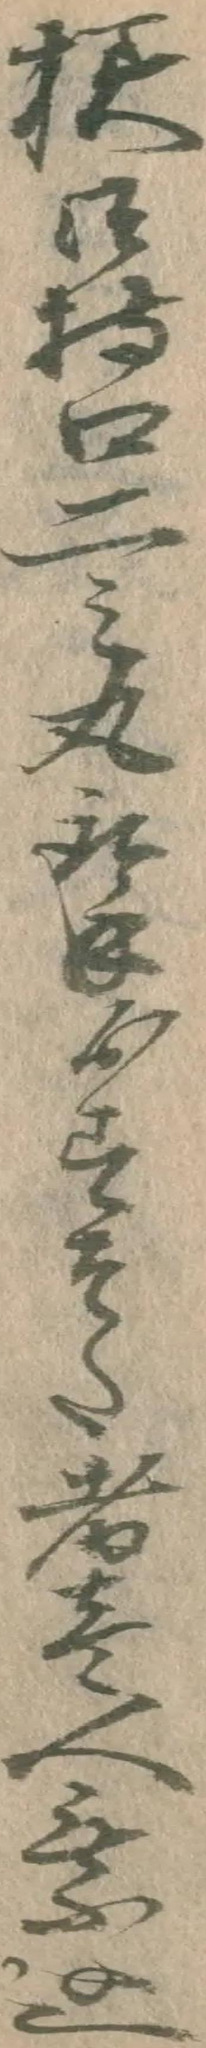様御持口二之丸取手ゟ春者た者壱人乗込
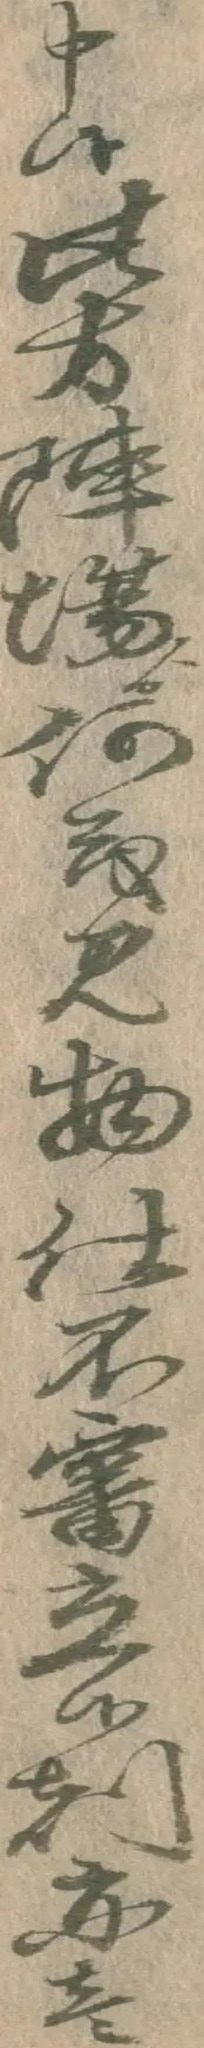申候此方陣場何茂見物仕不審立候刻亦壱
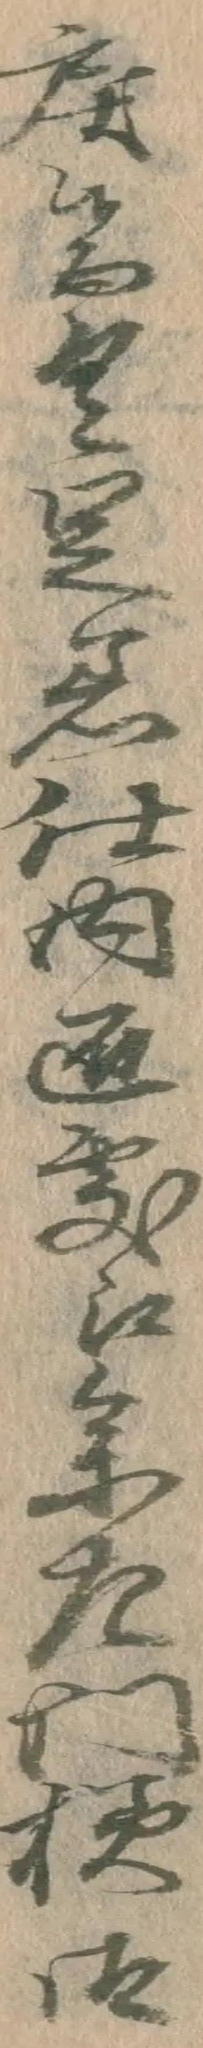戻候而具足着仕内匠處江参左門様御
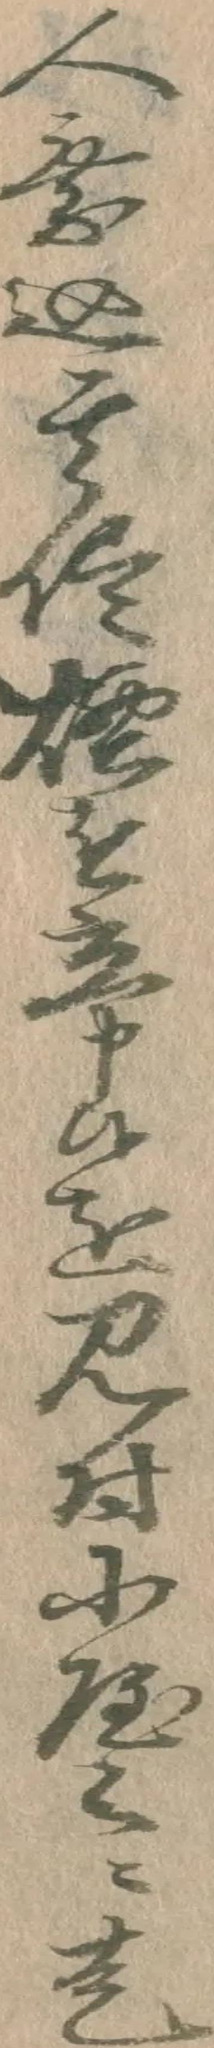人乗込其侭煙を立申候を見付小屋てに走
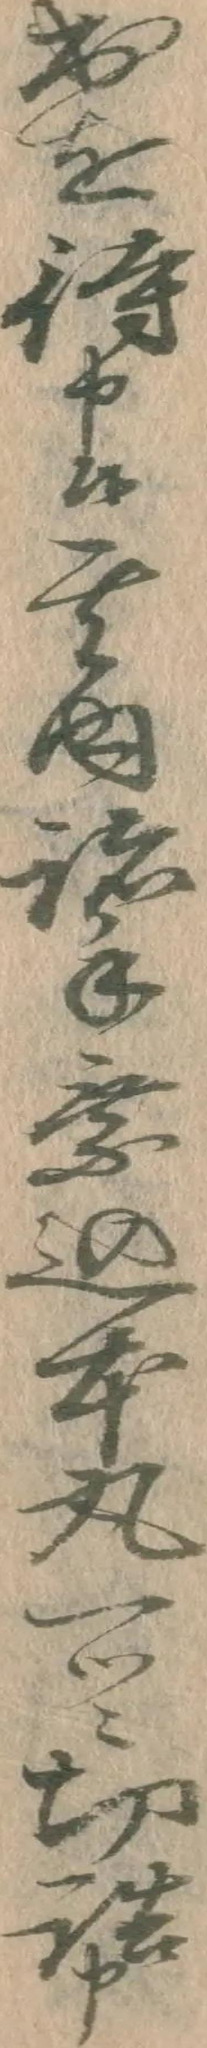出を待申候其内緒手乗込本丸一つに切詰申
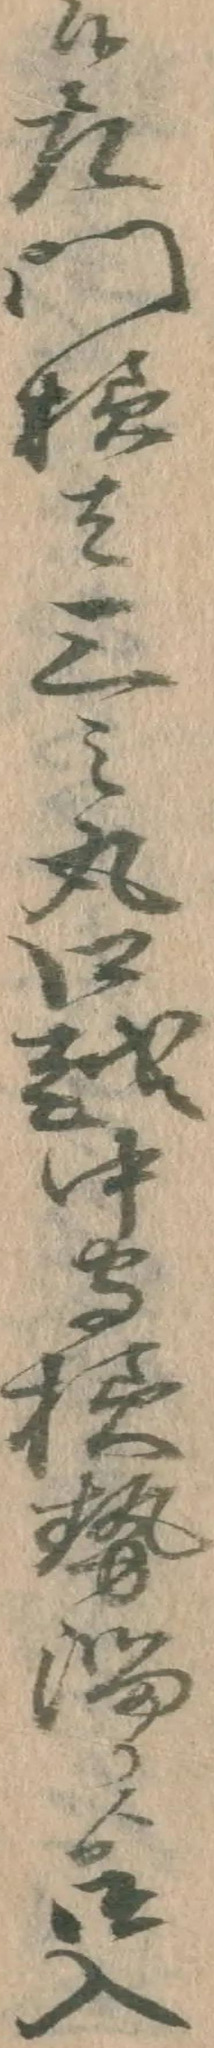候左門様者三之丸口越中守様勢溜りゟ御入
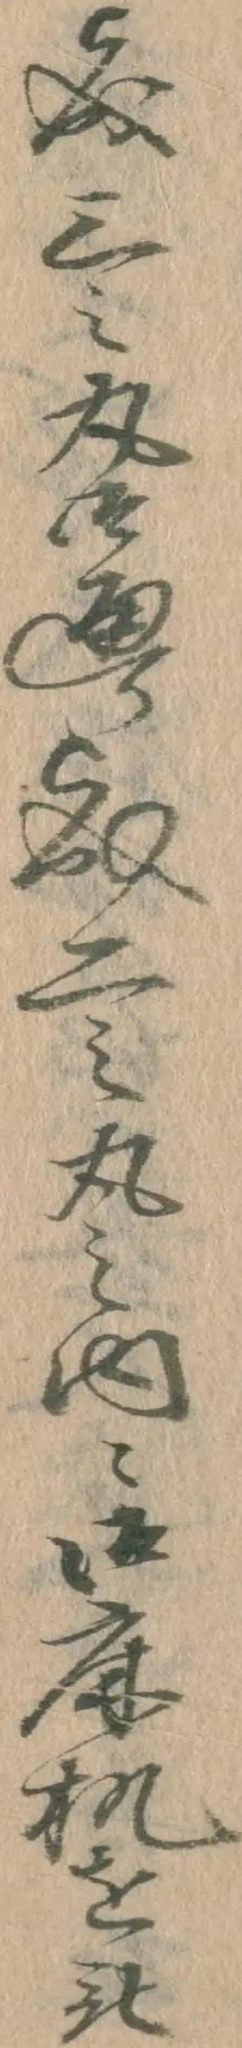被成三之丸御通り被成二之丸之内に御床机を被
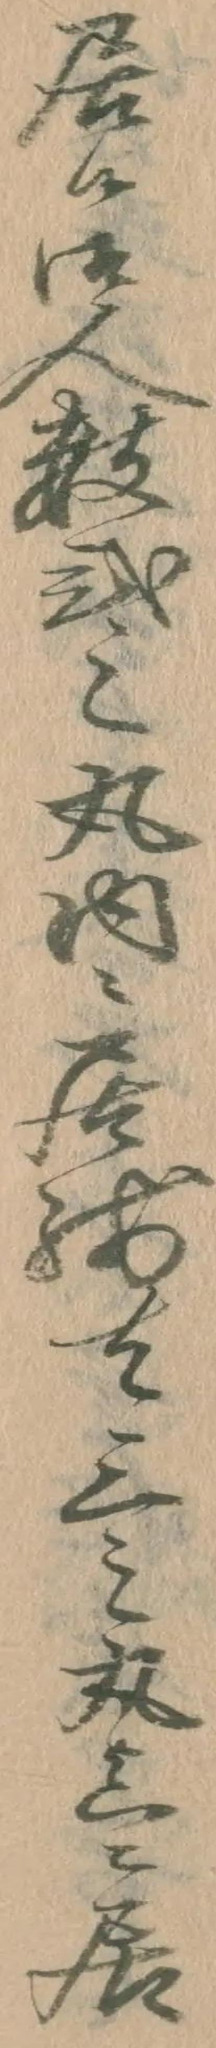居候御人数弐之丸内に居残者三之丸迄に居
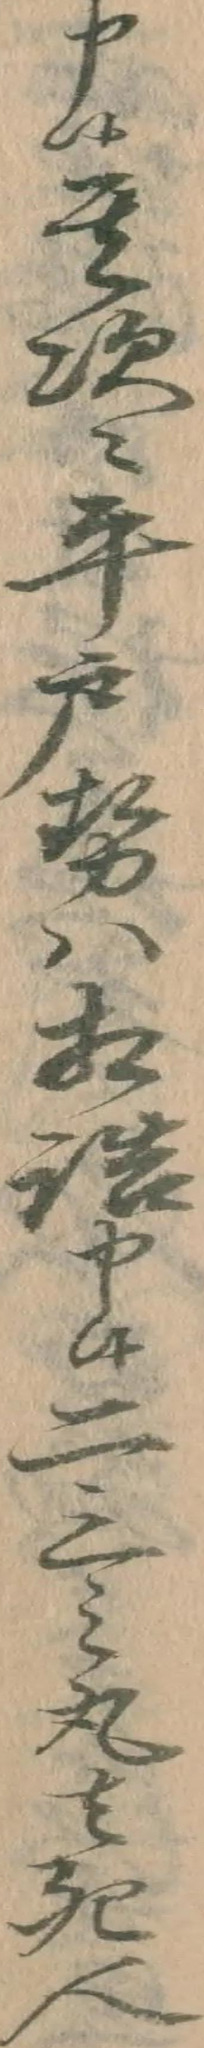申候其次に平戸勢は相詰申候二三之丸者死人
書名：切支丹御退治記 49巻. [8]
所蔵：国立国会図書館 National Diet Library, JAPAN
